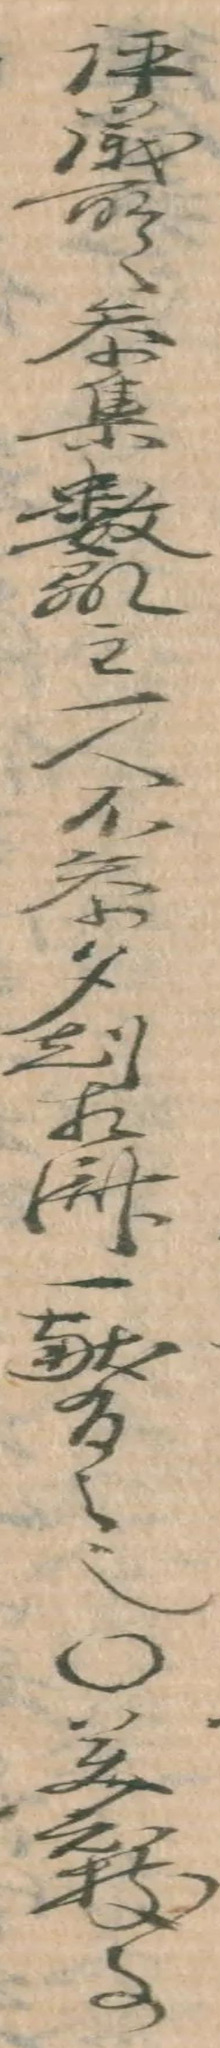評議所へ参集数顕主一人に参夕刻相済一献有之也○美知枝事
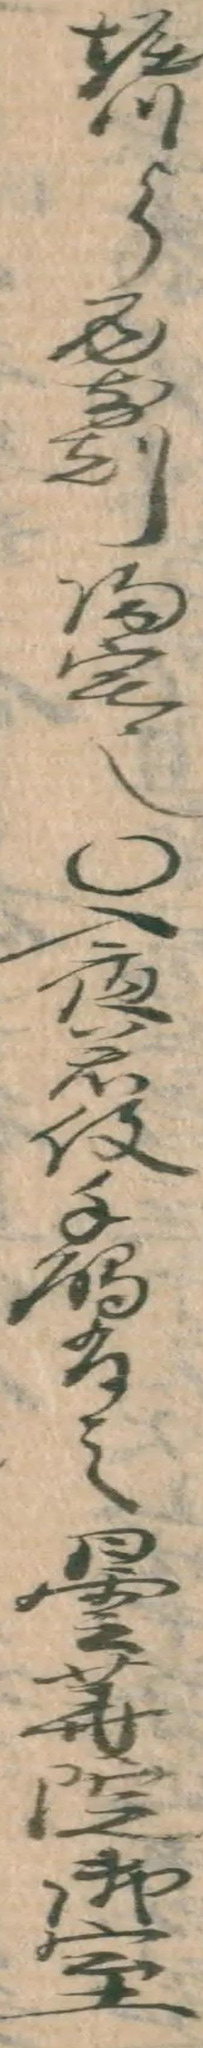堀川より酉前刻帰宅也○入夜若役手触有之曇華院御宝
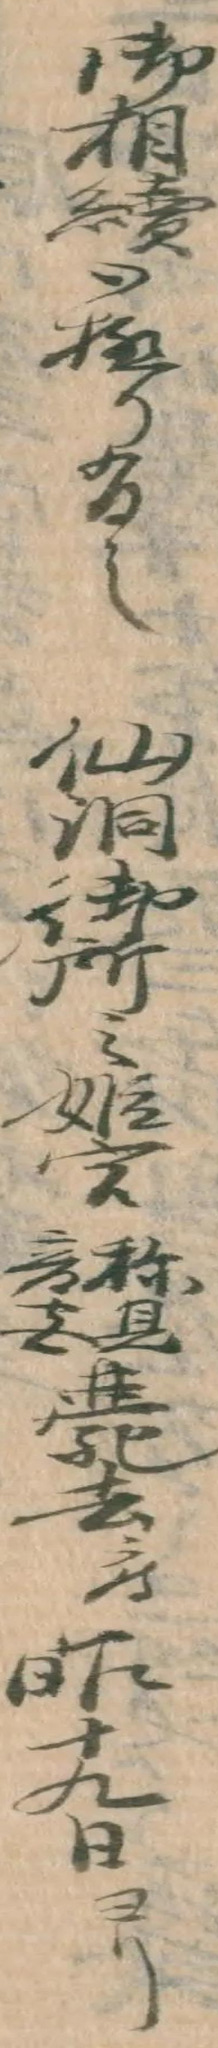御相續御極り有之仙洞御所之姫宮称具彦宮薨去ニ付昨十九日ヨリ
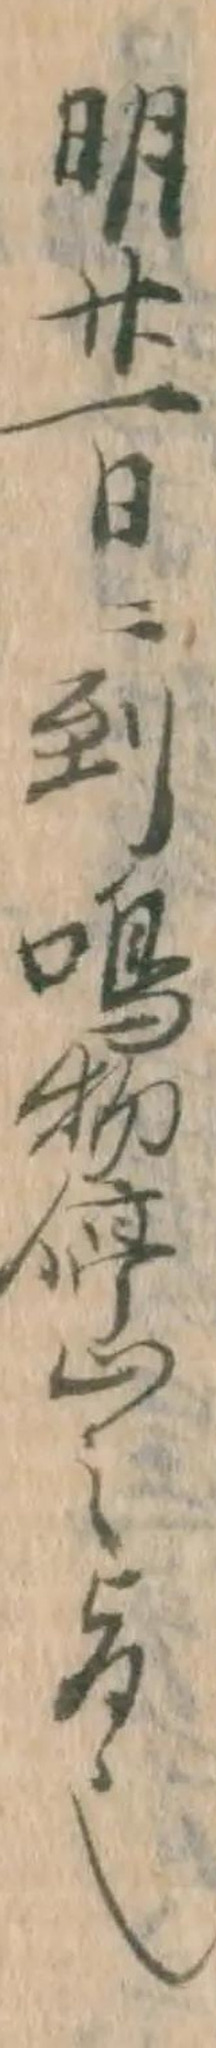明廿一日ニ到鳴物停止之旨也
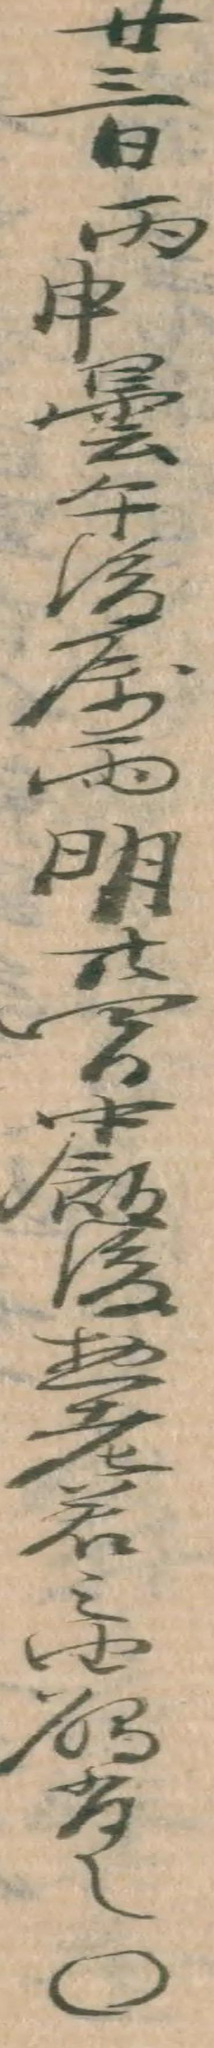廿三日丙申曇午後属雨明廿四日中飯後惣老若之由触有之○
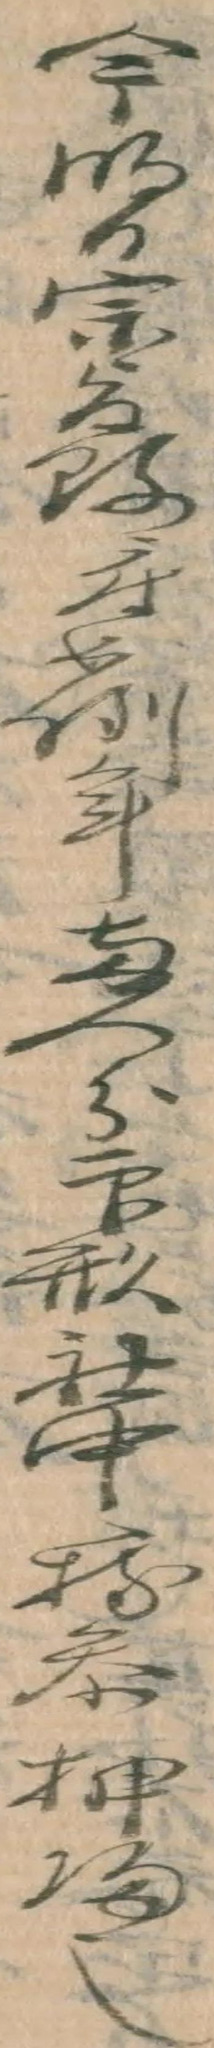今明日宗旨改ニ付如例年両人分印形社中へ持参押帰也
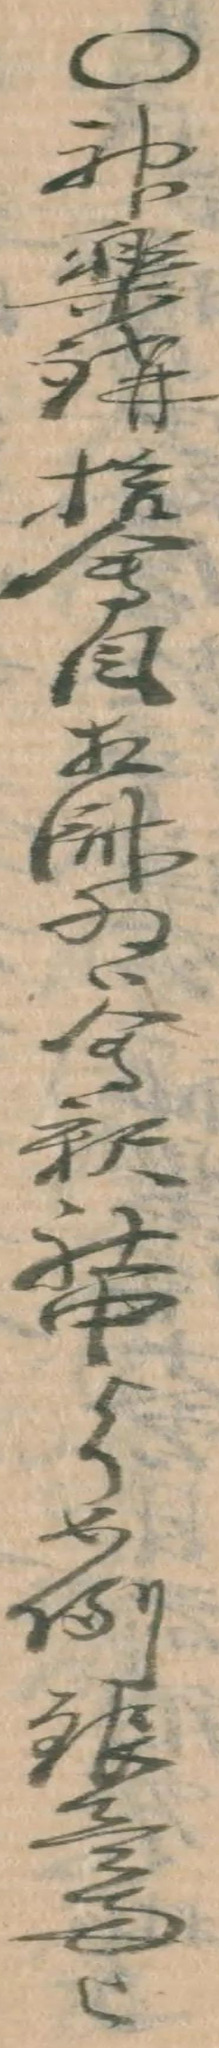○神楽講拾會目相済為御會釈社中より如例銀壱両被
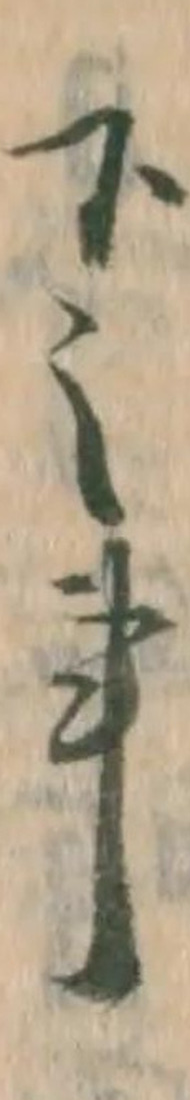下之事
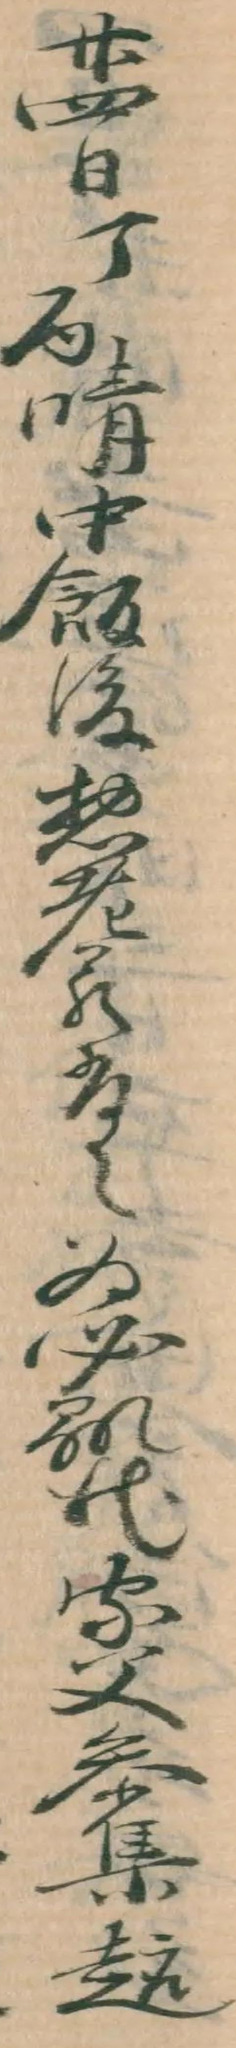廿四日丁酉晴中飯渡惣老若有之為必顕代家父参集趣
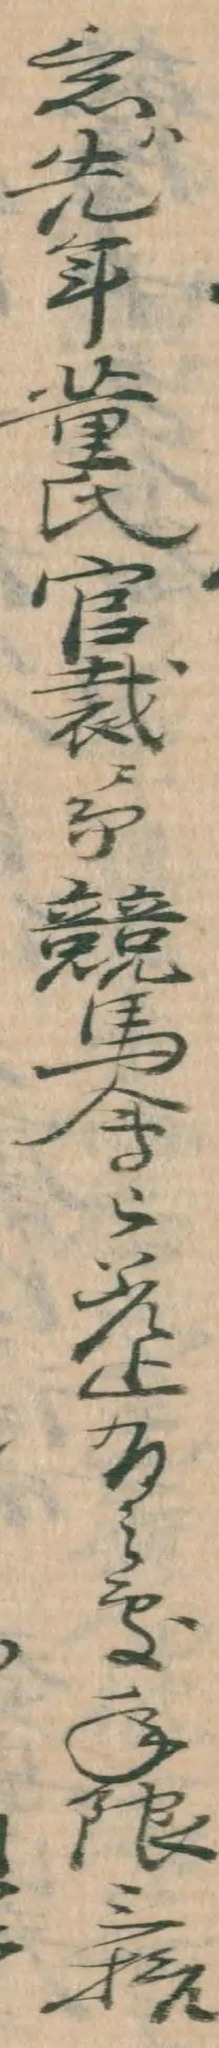意ハ先年董氏官裁ニ而競馬會被差止有之處年限三拾
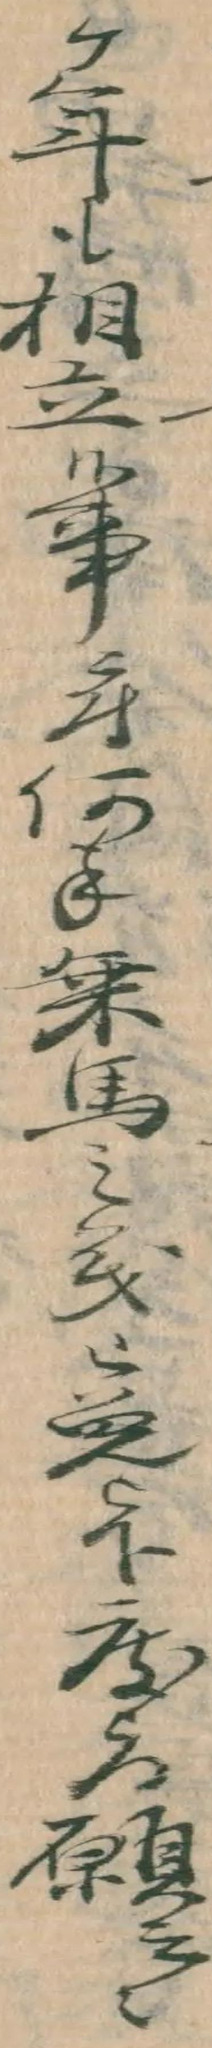ケ年も相立候事ニ付何手乗馬之義被免被下度旨願云々
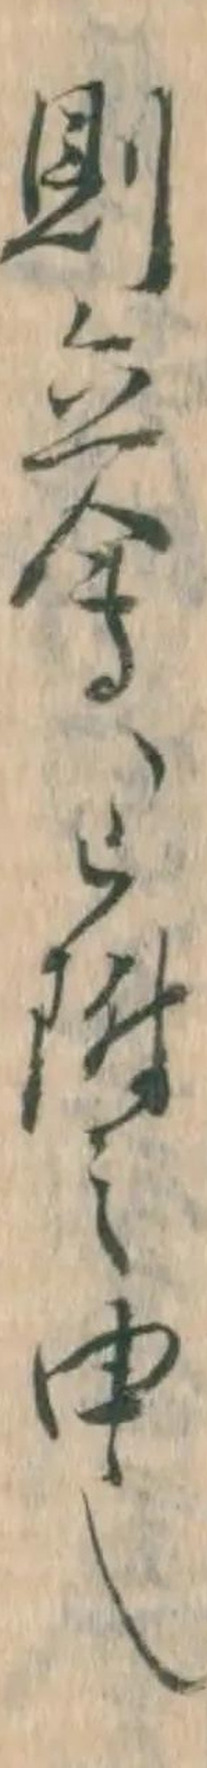則立會へ被附之由也
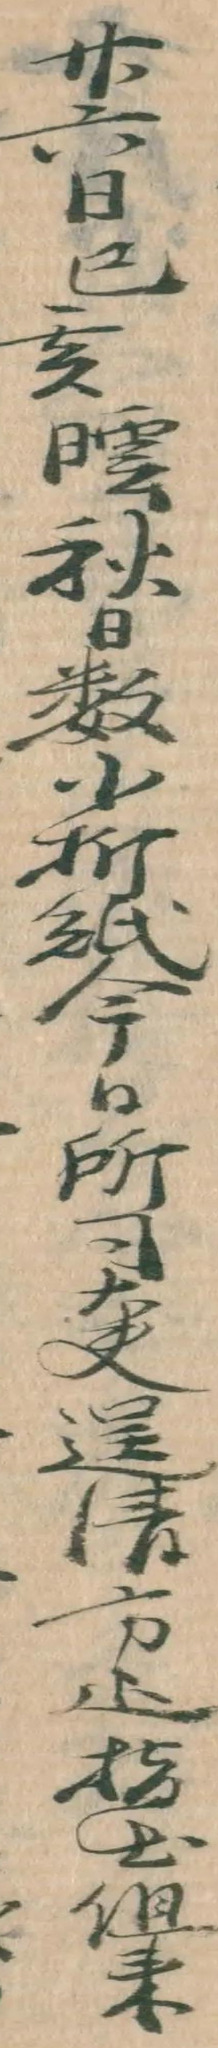廿六日己亥曇秋日数小折紙今日所司大夫逞清方迄指出但来
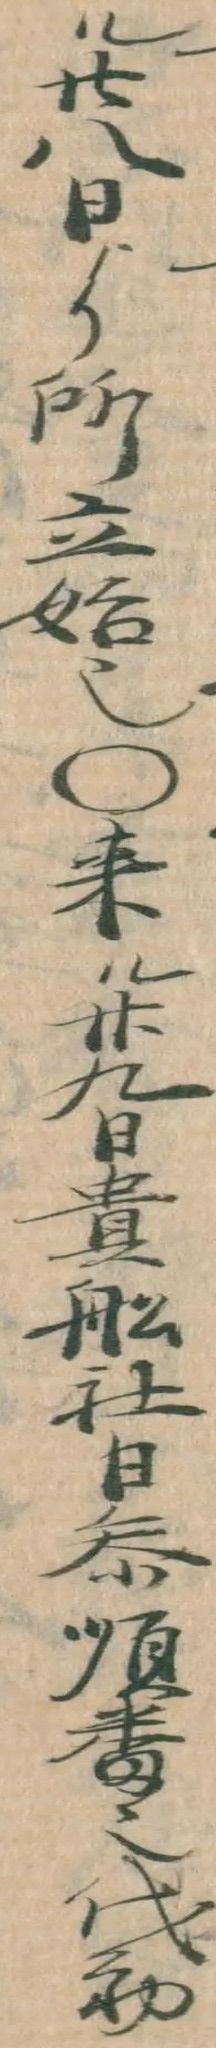ル廿八日より所立始也〇来ル廿九日貴船社日参順番之代勤
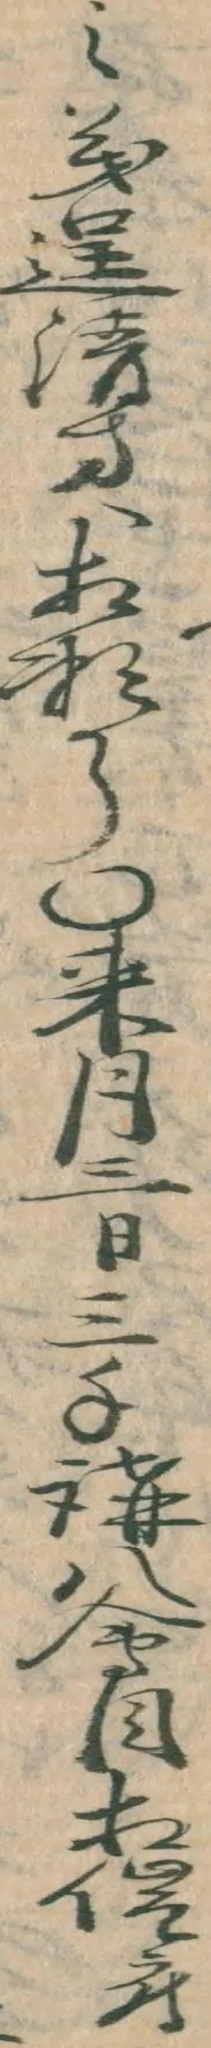之義逞清方へ相頼了〇来月三日三手講八會目相催ニ付
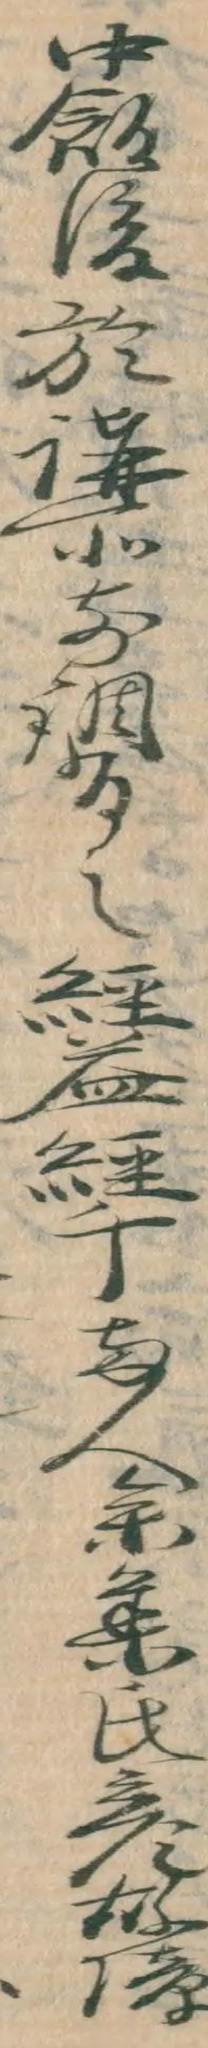中飯後於講所前調有之経益経千両人参集氏産故障
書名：賀茂社記録. 第65冊
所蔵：国立国会図書館 National Diet Library, JAPAN
